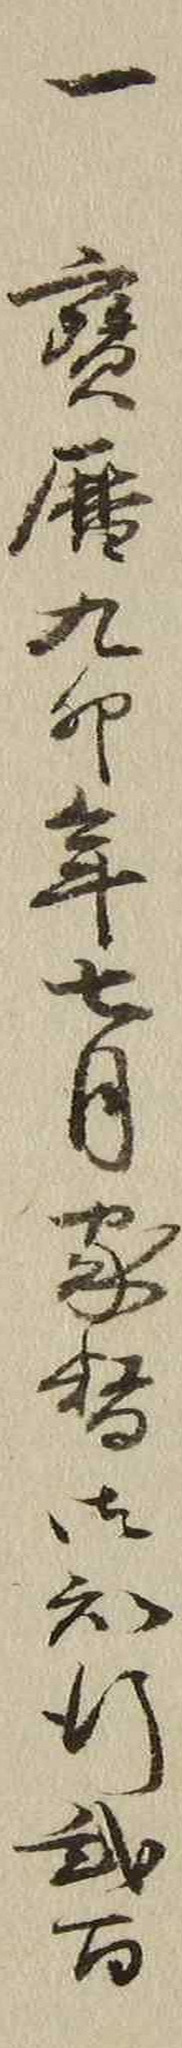一宝暦九卯年七月家督御知行弐百
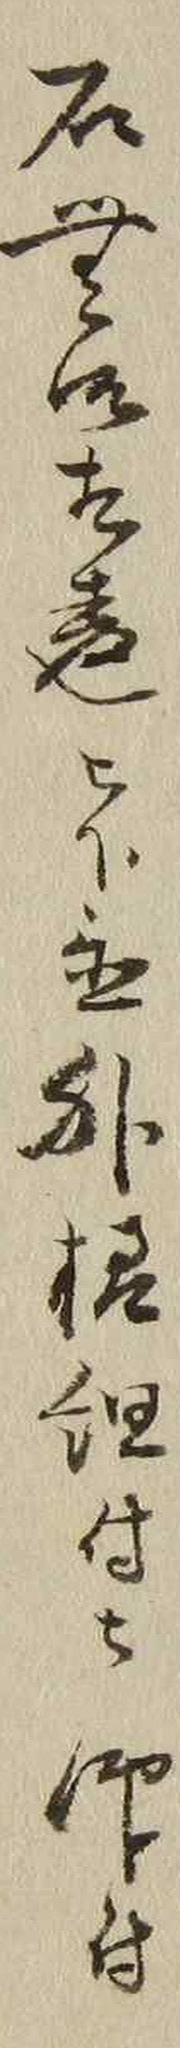石無御相違被下置外様組付被仰付
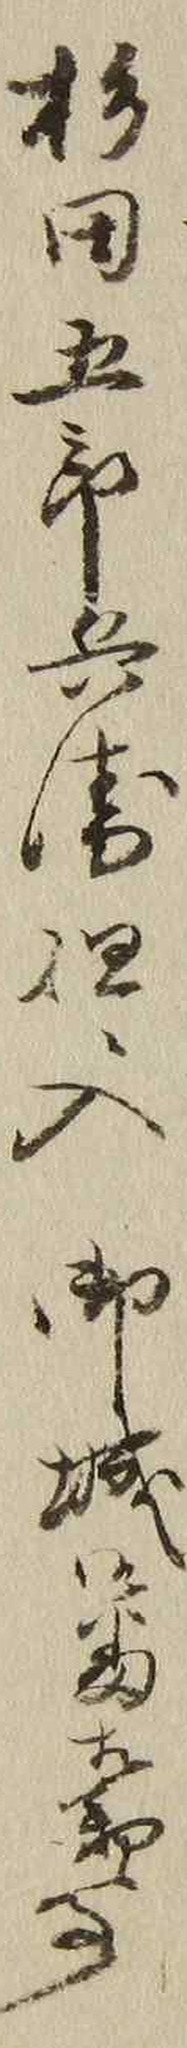杉田五郎兵衛組ニ入御城御番相勤候事
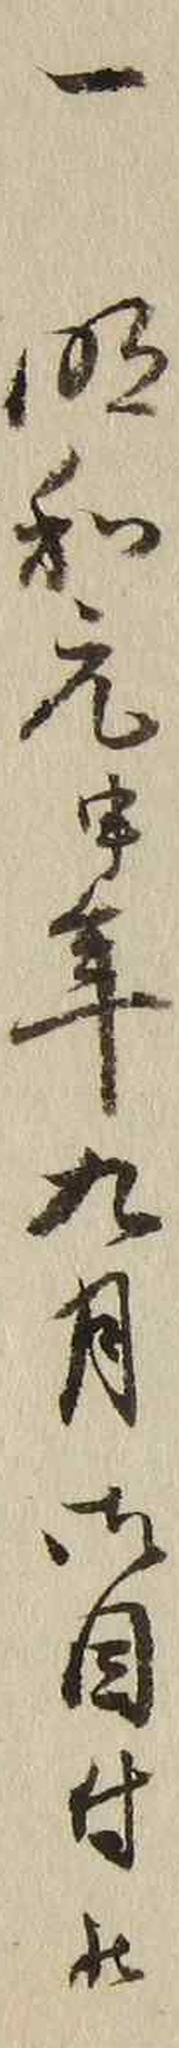一明和元申年九月御目付被
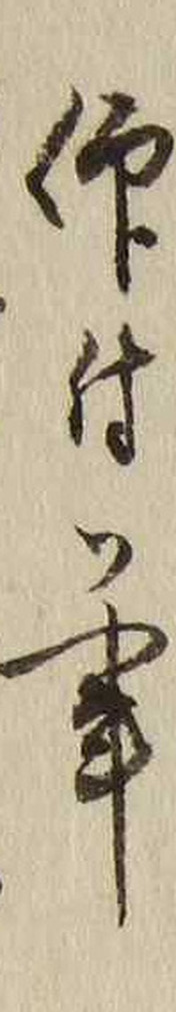仰付候事
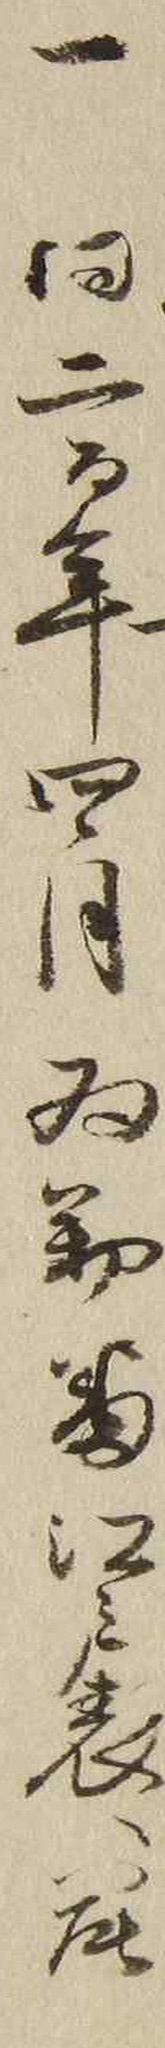一同二酉年四月為勤番江戸表へ罷
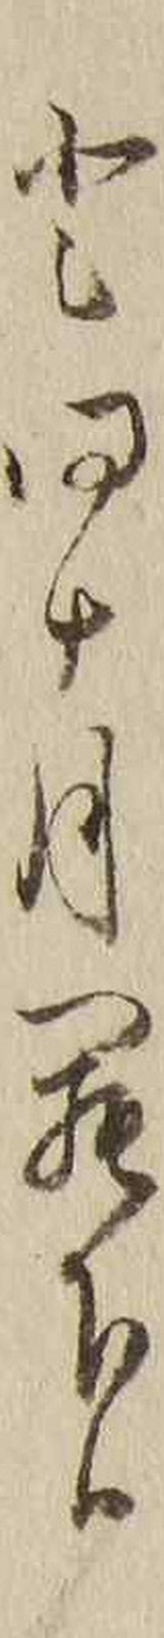登同十月罷下候

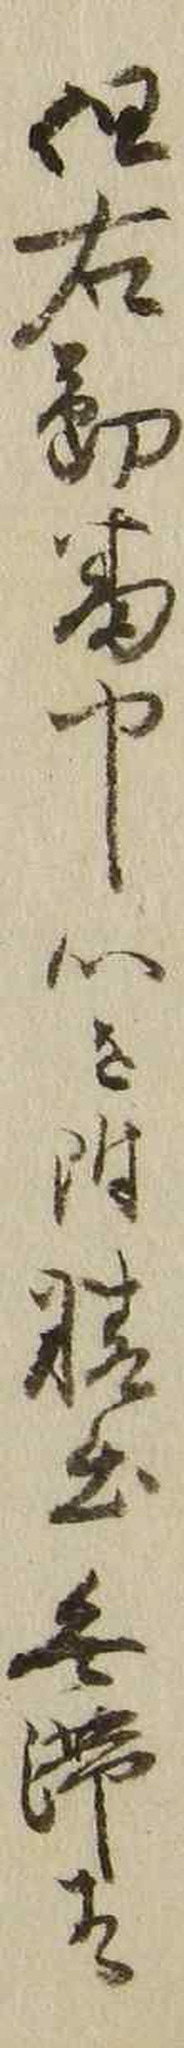但右勤番中心を附精出無滞相
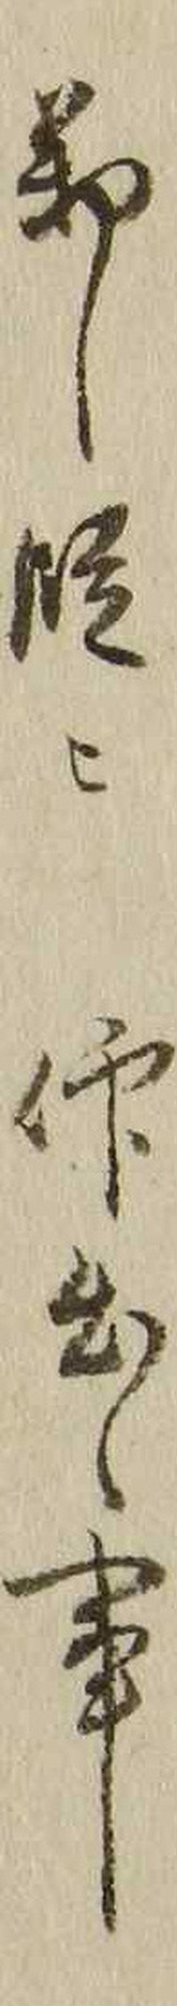勤候段被仰出候事
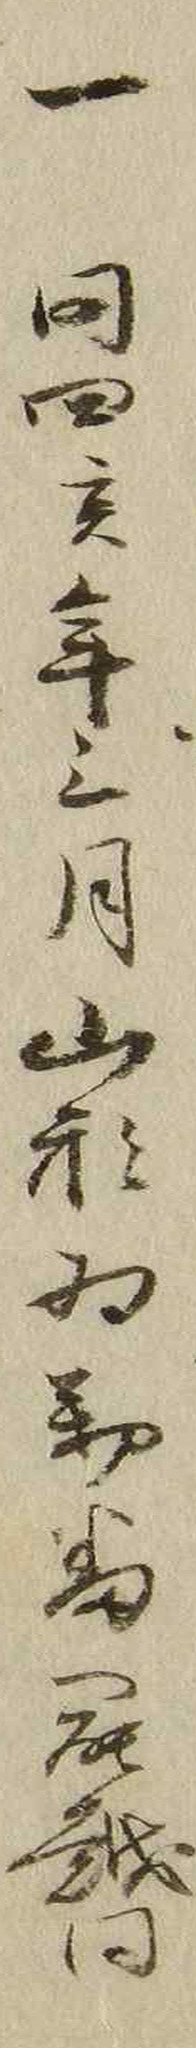一同四亥年三月山形為勤番罷越同
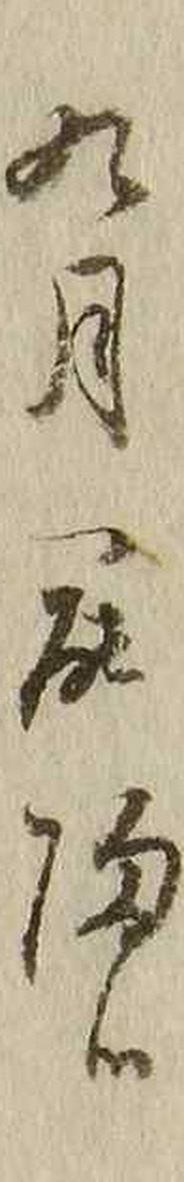九月罷帰候
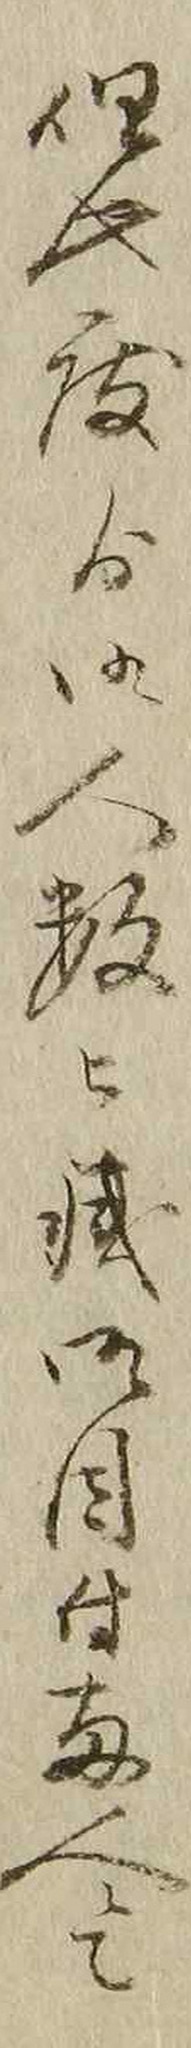但此度ゟ御人数被減御目付両人ニて
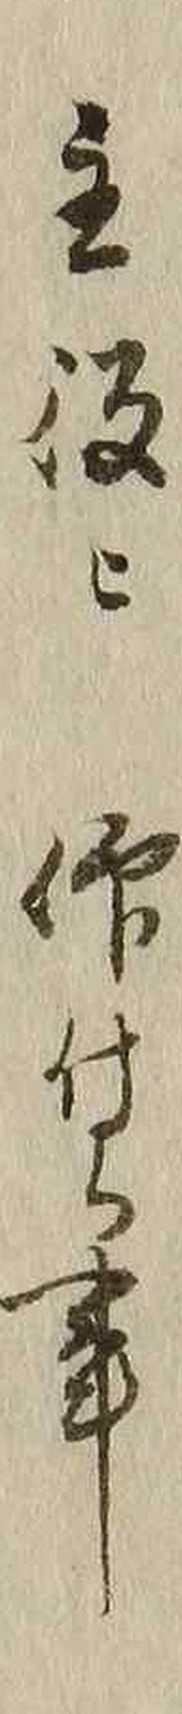主役被仰付候事
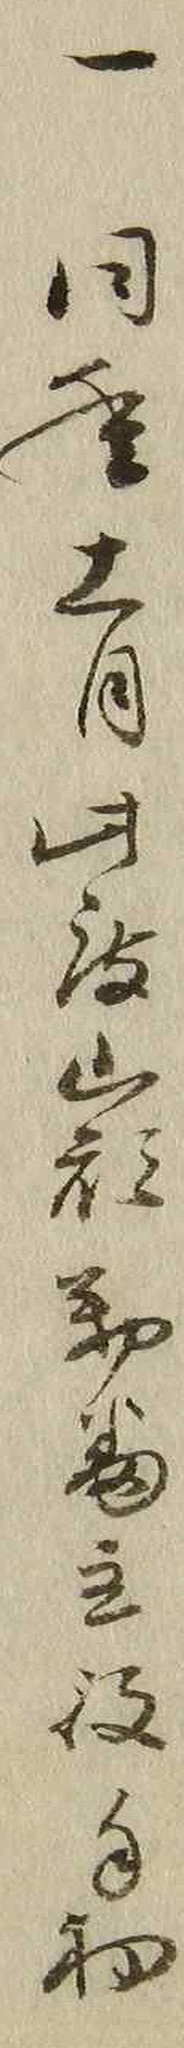一同年十一月此度山形勤番主役手初
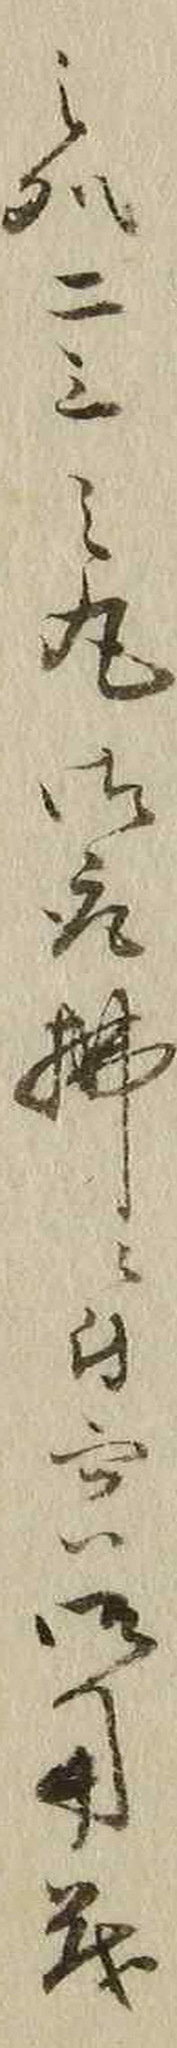之処ニ三之丸御取払ニ付而ハ御用茂
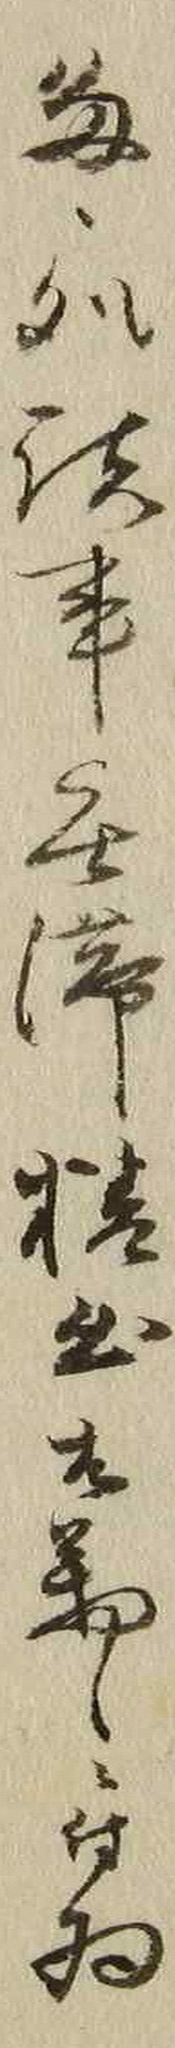多候処諸事無滞精出相勤候ニ付為
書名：諸士系譜　巻之225　ま之部6
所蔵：会津若松市立会津図書館
